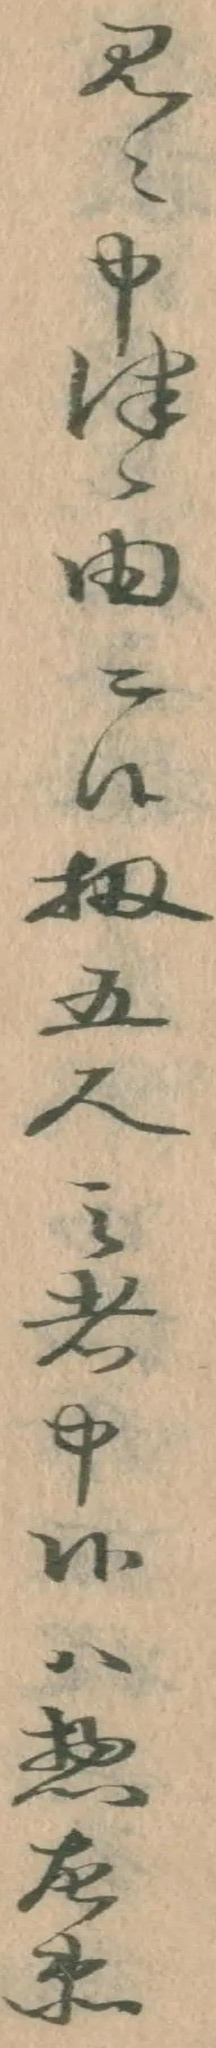見に申つゝ由に候扨五人之者申候は惣左衛
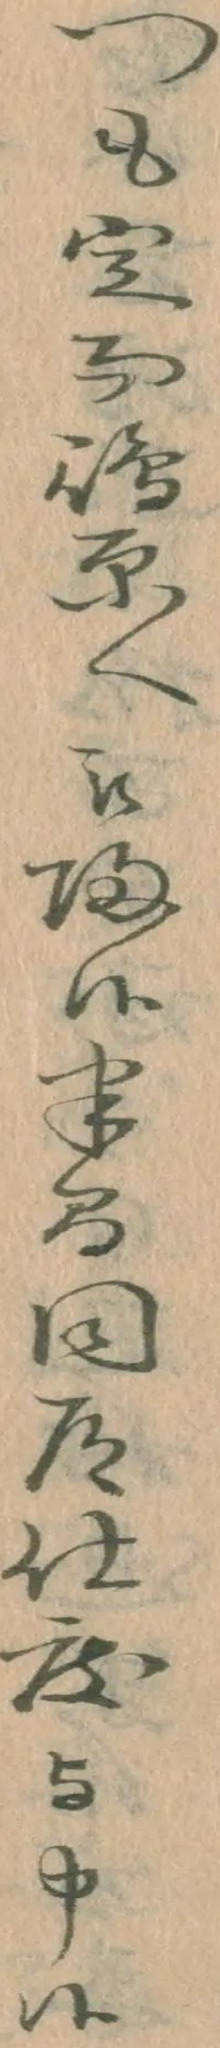門も定而島原へ被帰候半間同道仕度与申候
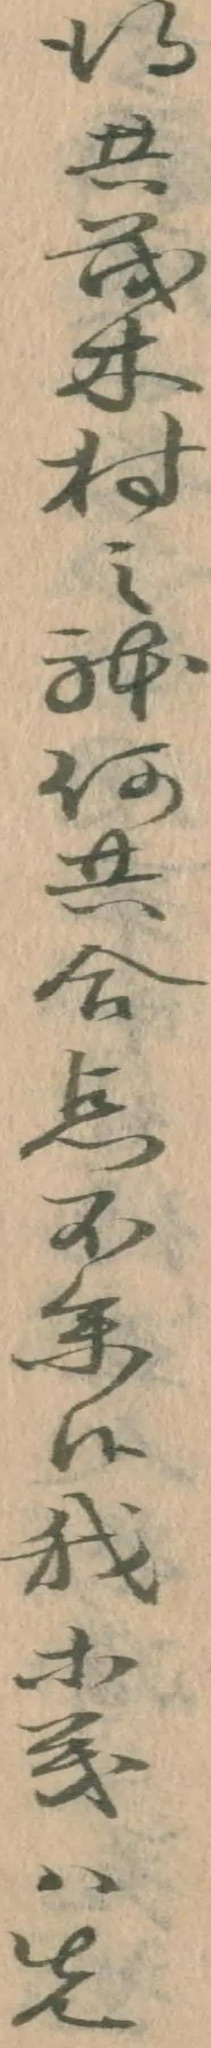得共茂木村之躰何共合点不参候我等義は先
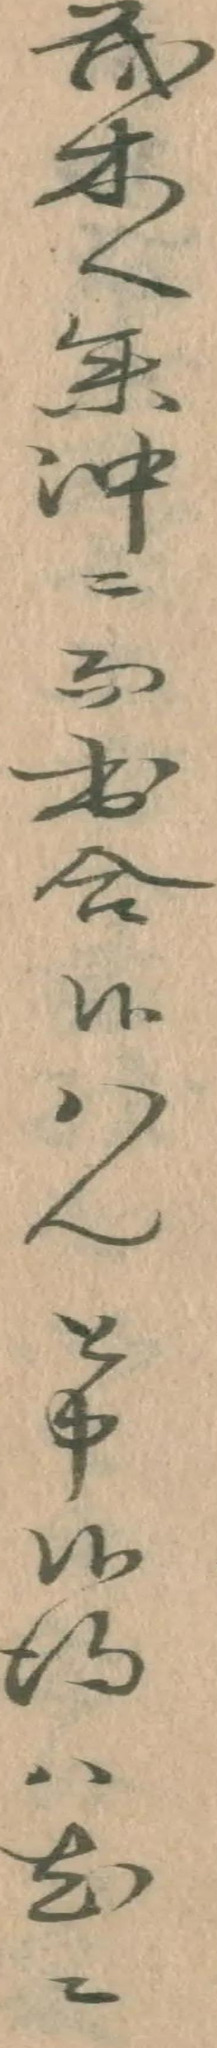茂木へ参沖に而出合候はんと申候得は尤に
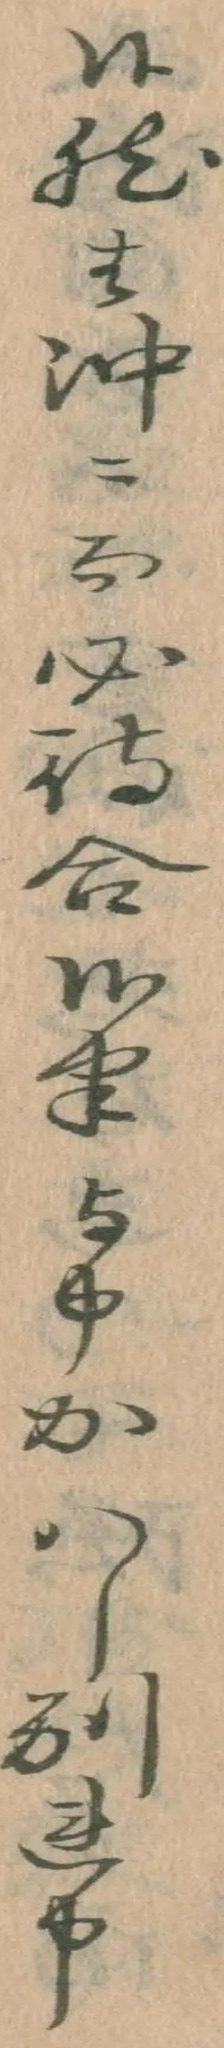候然は沖に而必待合候半与申かはし別れ申
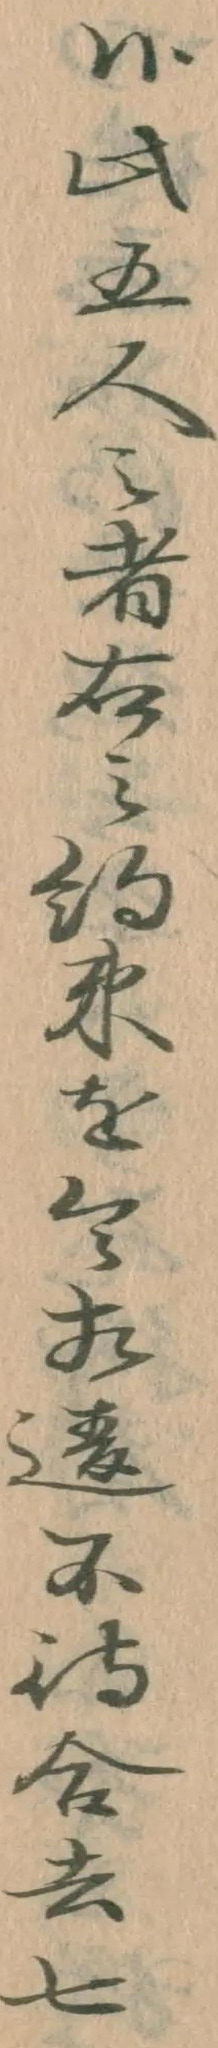候此五人之者右之約束を今相違不待合去七
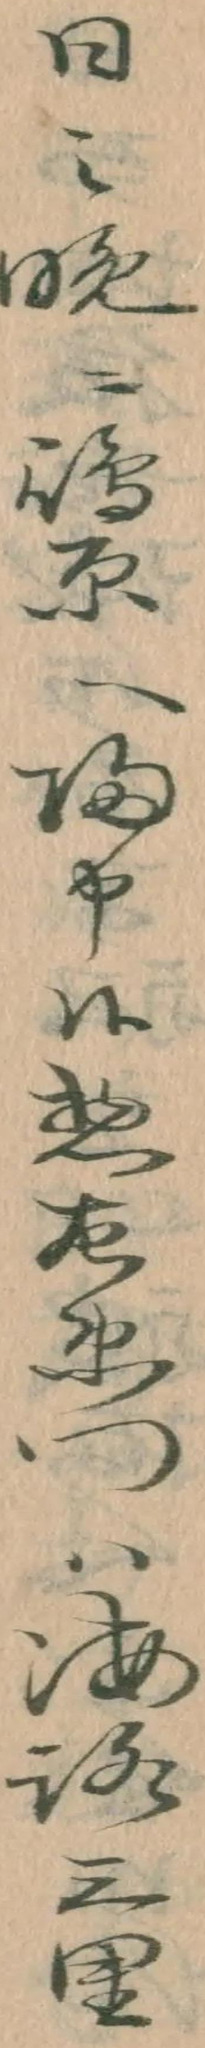日之晩に島原へ帰申候惣左衛門は海路三里
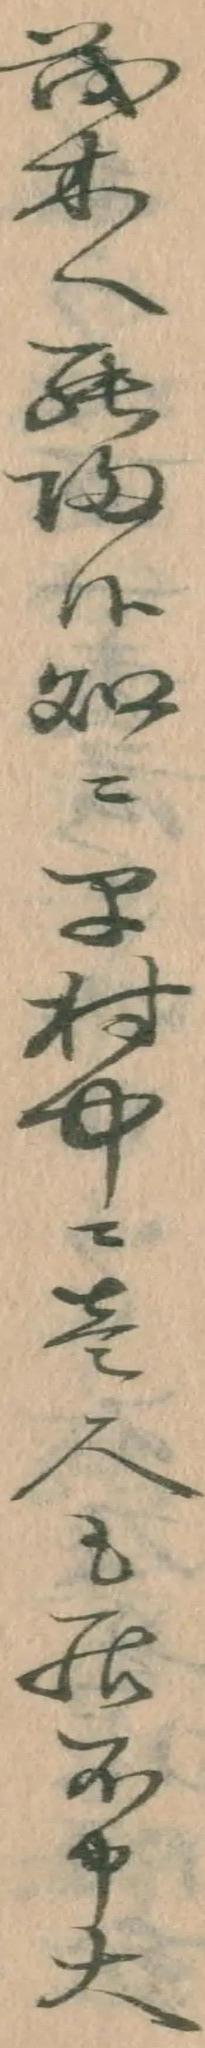茂木へ罷帰候処に早村中に壱人も居不申大
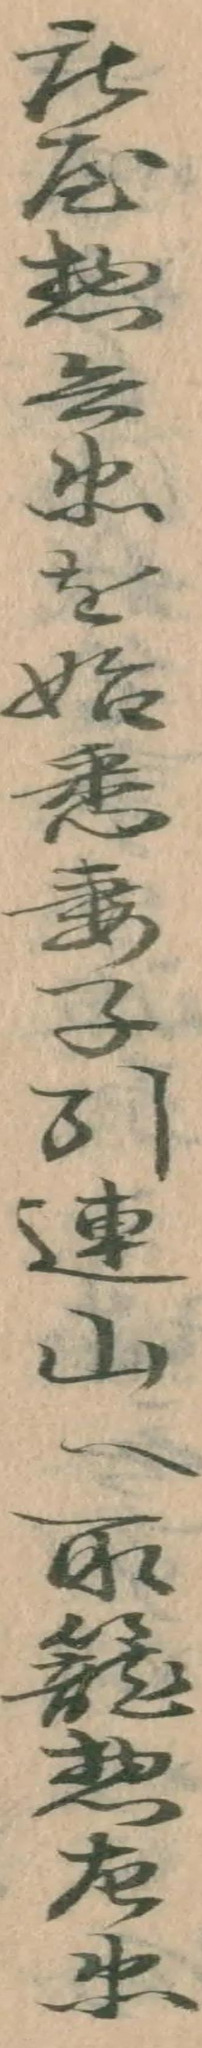庄屋惣兵衛を始悉妻子引連山へ取籠惣左衛
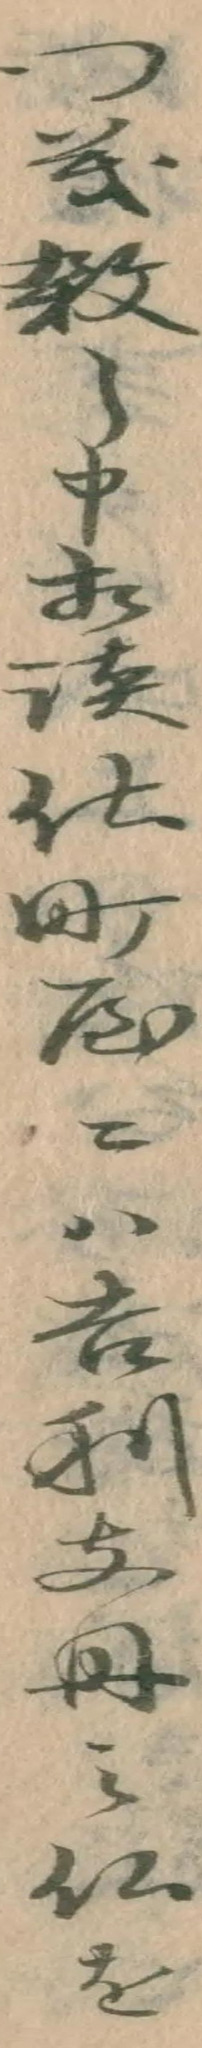門義殺し申相談仕町屋には吉利支丹之仏を
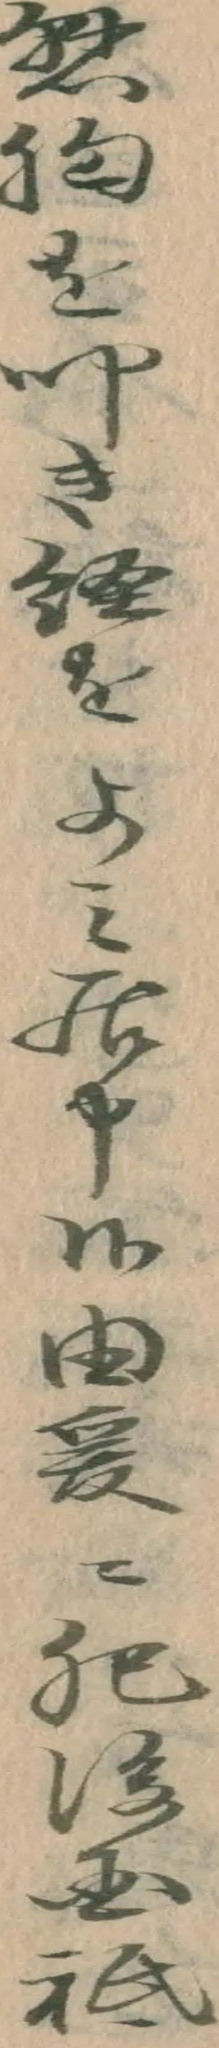懸胸を叩き経をよみ居申候由爰に肥後国祇
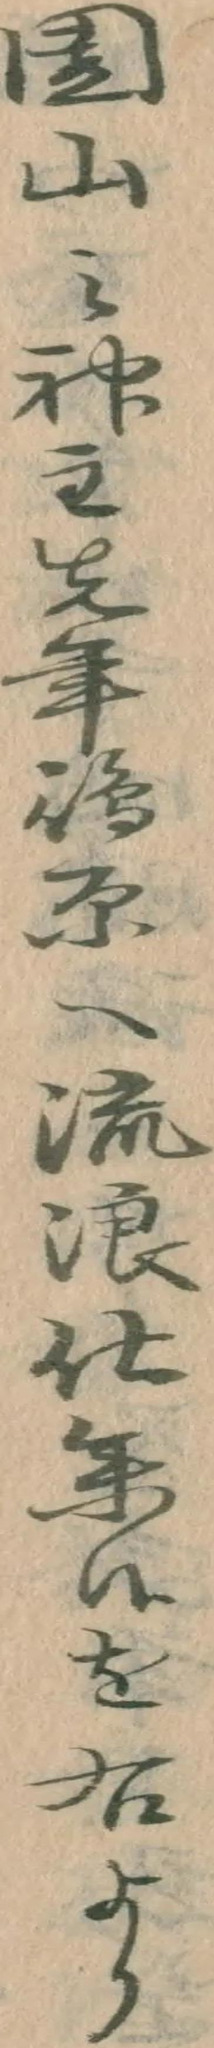園山之神主先年島原へ流浪仕参候を右より
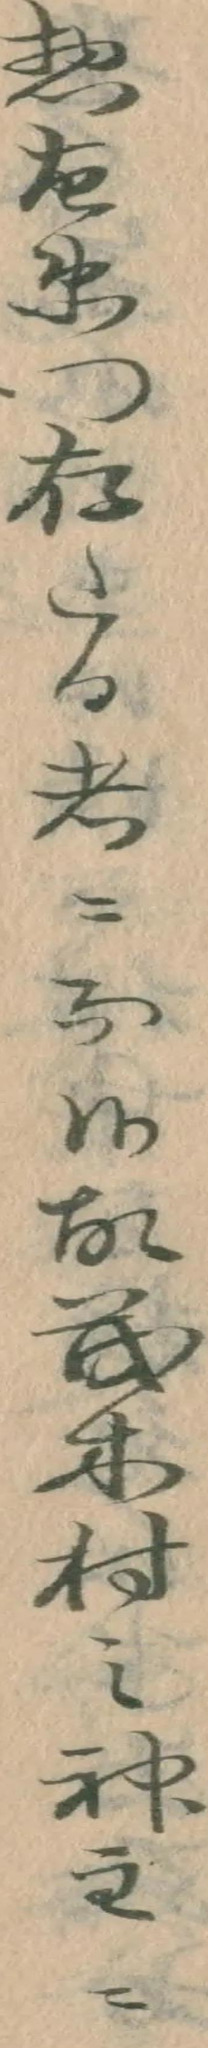惣左衛門存たる者に而候故茂木村之神主に
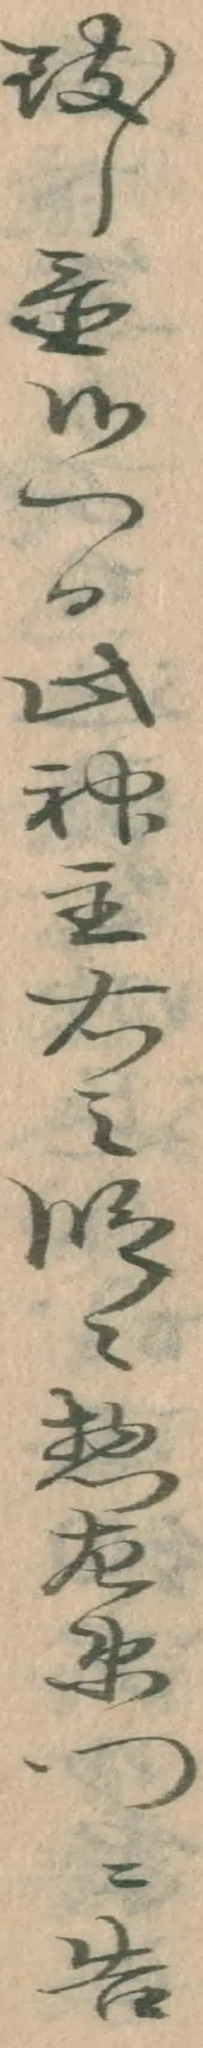致し置候つる此神主右之段々惣左衛門に告
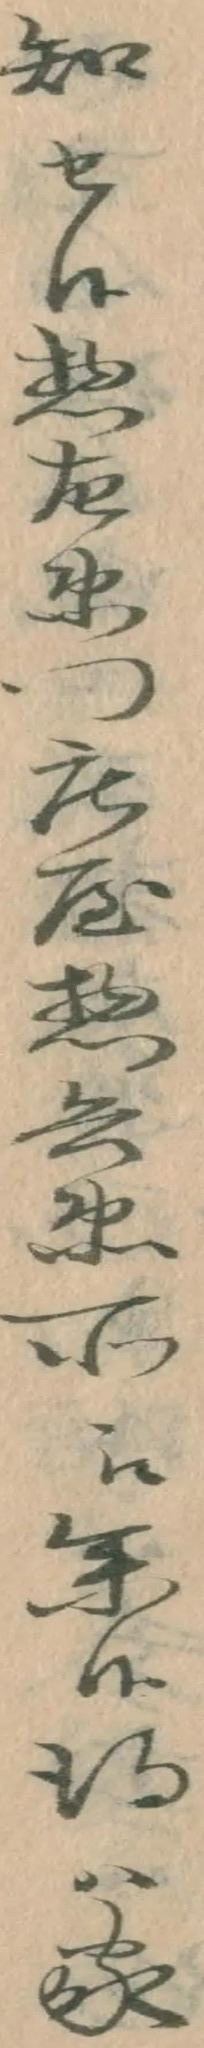知せ候惣左衛門庄屋惣兵衛所え参候得は家
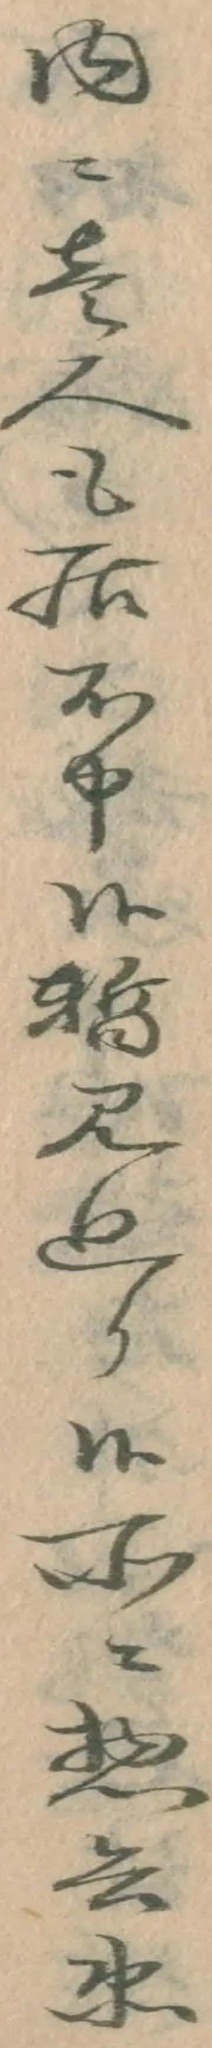内に壱人も居不申候暫見廻り候所に惣兵衛
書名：切支丹御退治記 49巻. [1]
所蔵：国立国会図書館 National Diet Library, JAPAN
